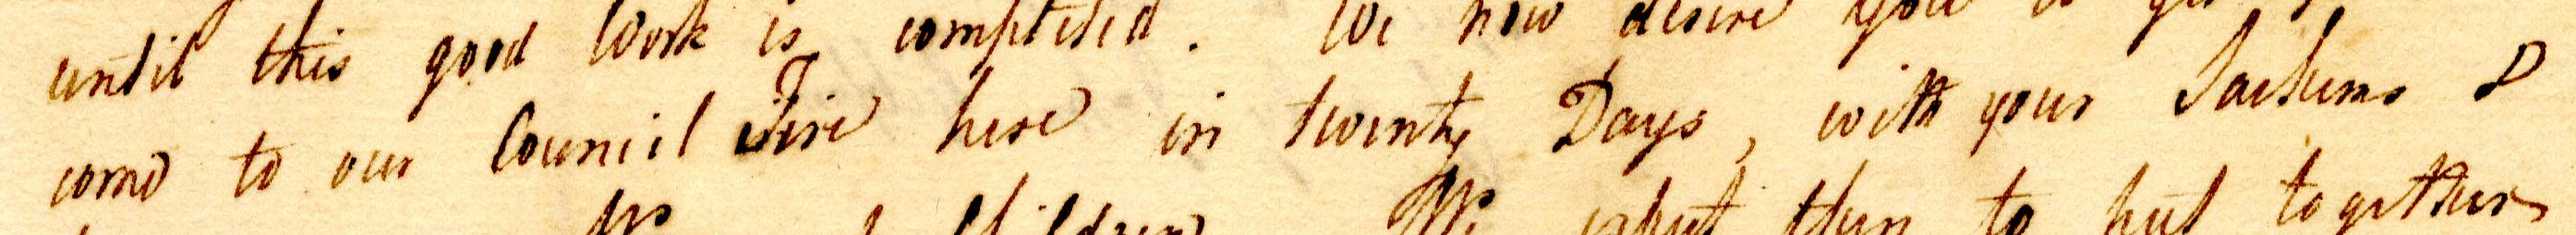come to our Council Fire here in twenty Days, with your Sachums &
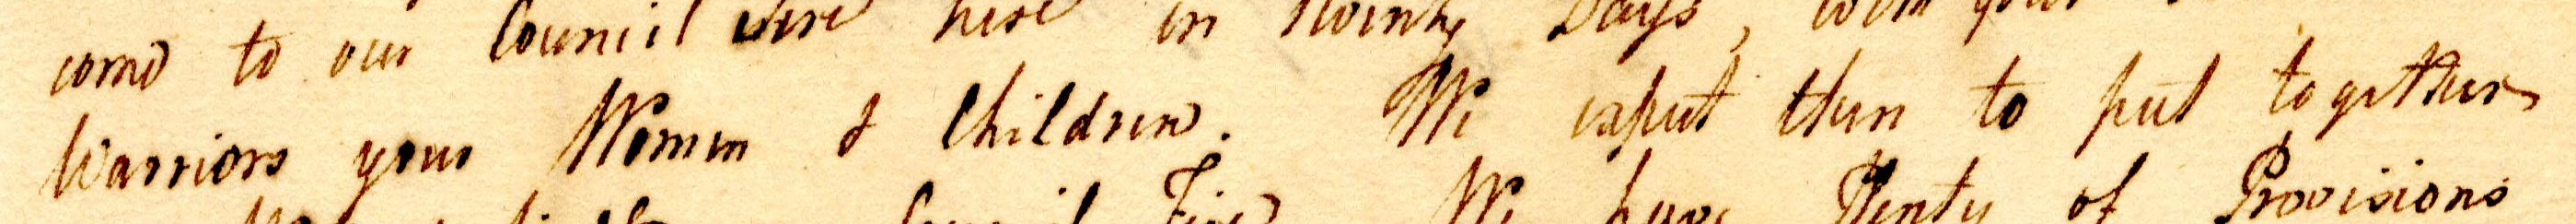Warriors your Women & Children. We expect then to put together
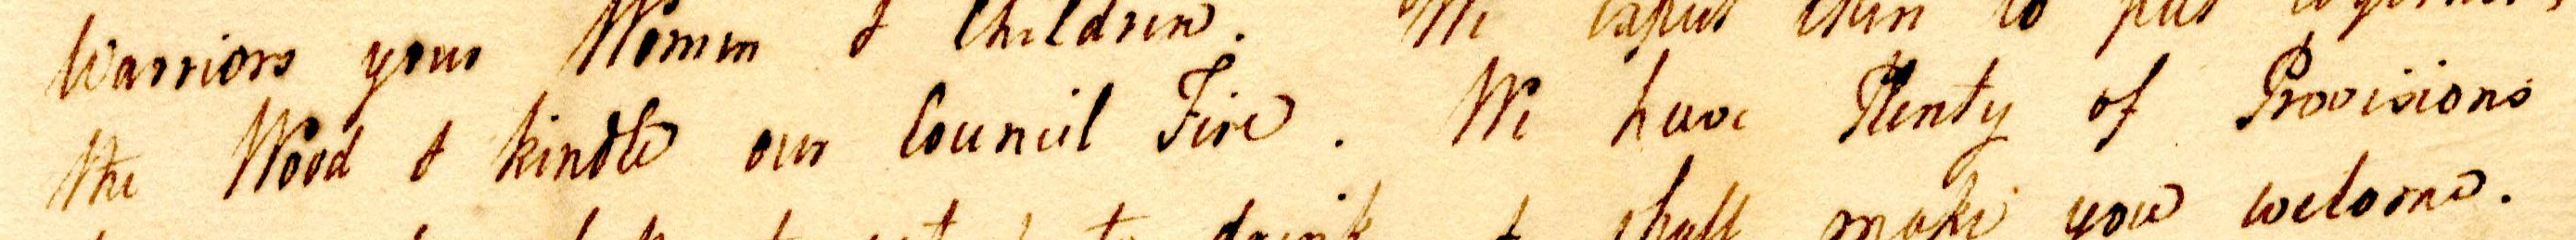the Wood & kindle our Council Fire. We have Plenty of Provisions
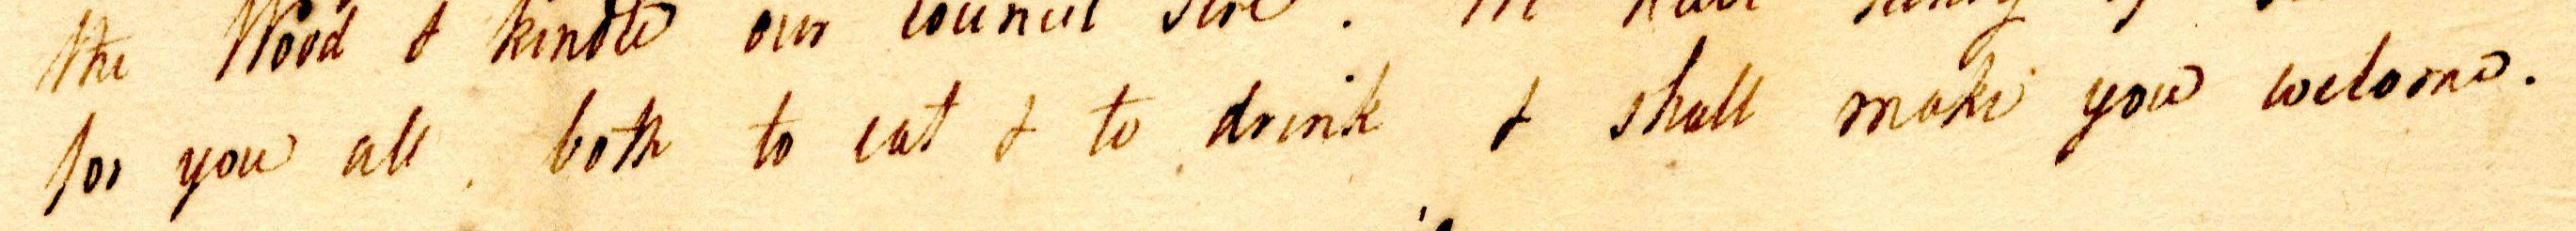for you all both to eat & to drink & shall make you welcome.
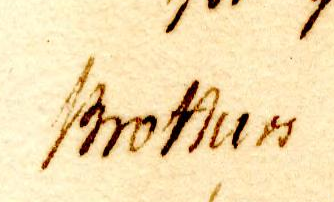Brothers
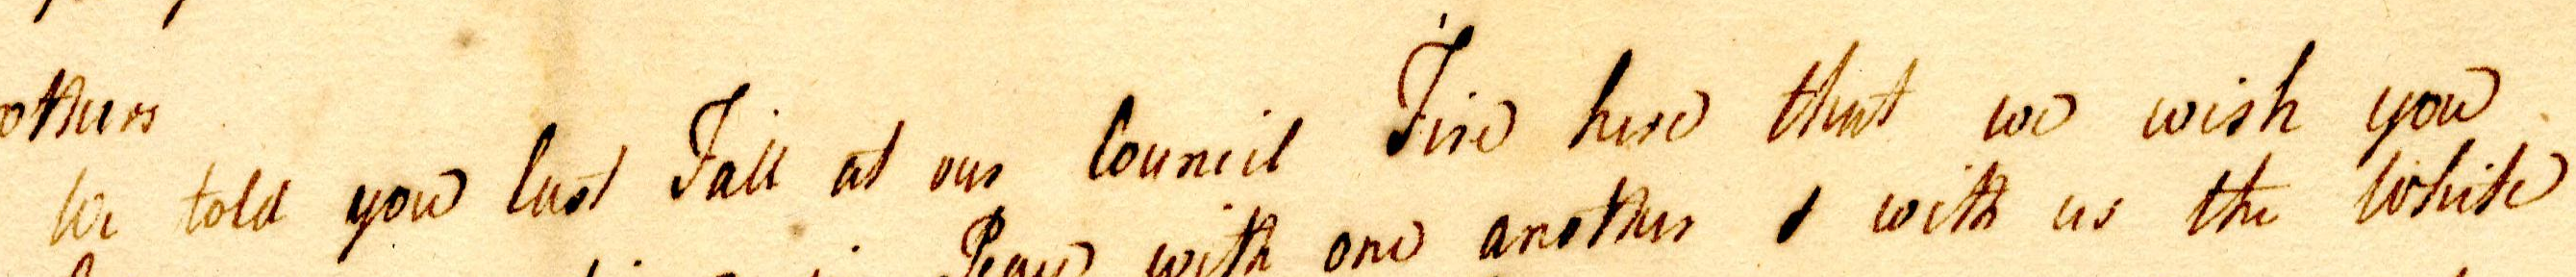We told you last Fall at or Council Fire here that we wish you
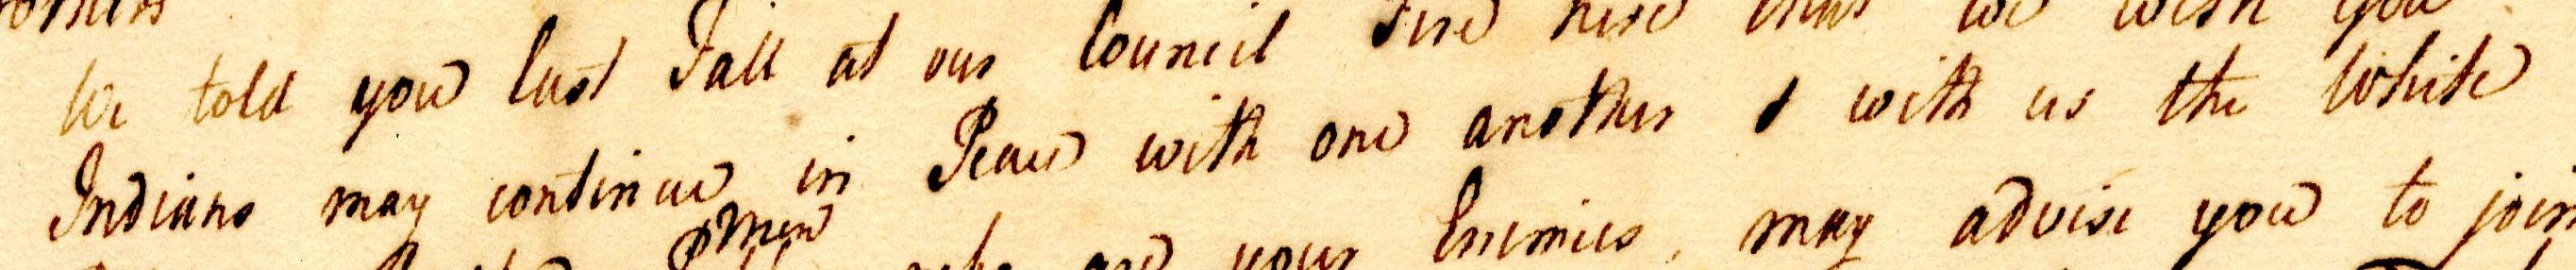Indians may continue in Peace with one another & with us the White
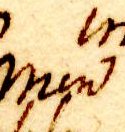men
